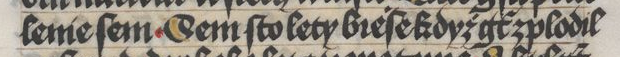lenie ſem.Gem ſto lety bieẛe kdyż ḡt zplodil
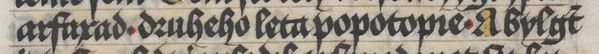arfarad.druheho leta popotopie.A byl ḡt
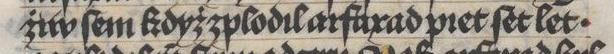żiw ſem kdyż zplodil arfaxad piet ſet let.
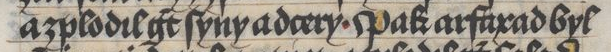a zplodil ḡt ſyny a dcery.Pak arfaxad byl
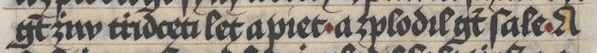ḡt żiw tṙidceti let a piet.a zplodil ḡt ſale.A
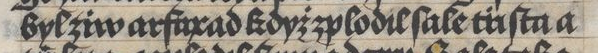byl żiw arfaxad kdyż zplodil ſale tṙiſta a
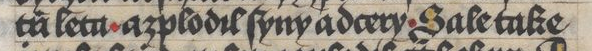tṙi leta.a zplodil ſyny a dcery.Sale take
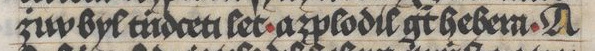żiw byl tṙidceti let.a zplodil ḡt hebera.A
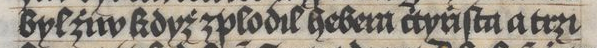byl żiw když zplodil hebera ċtyṙiſta a trzi¬
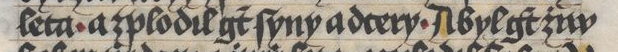leta.a zplodil ḡt ſyny a dcery.Abyl ḡt żiw
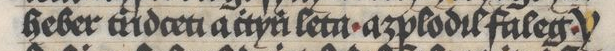heber tṙidceti a ċtyṙi leta.a zplodil faleg.Y
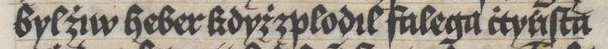byl żiw heber kdyż zplodil falega ċtyṙiſta
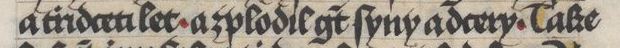a tṙidceti let.a zplodil ḡt ſyny a dcery.Take
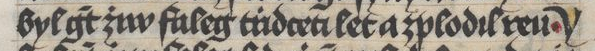byl ḡt żiw faleg tṙidceti let a zplodil reu.Y
